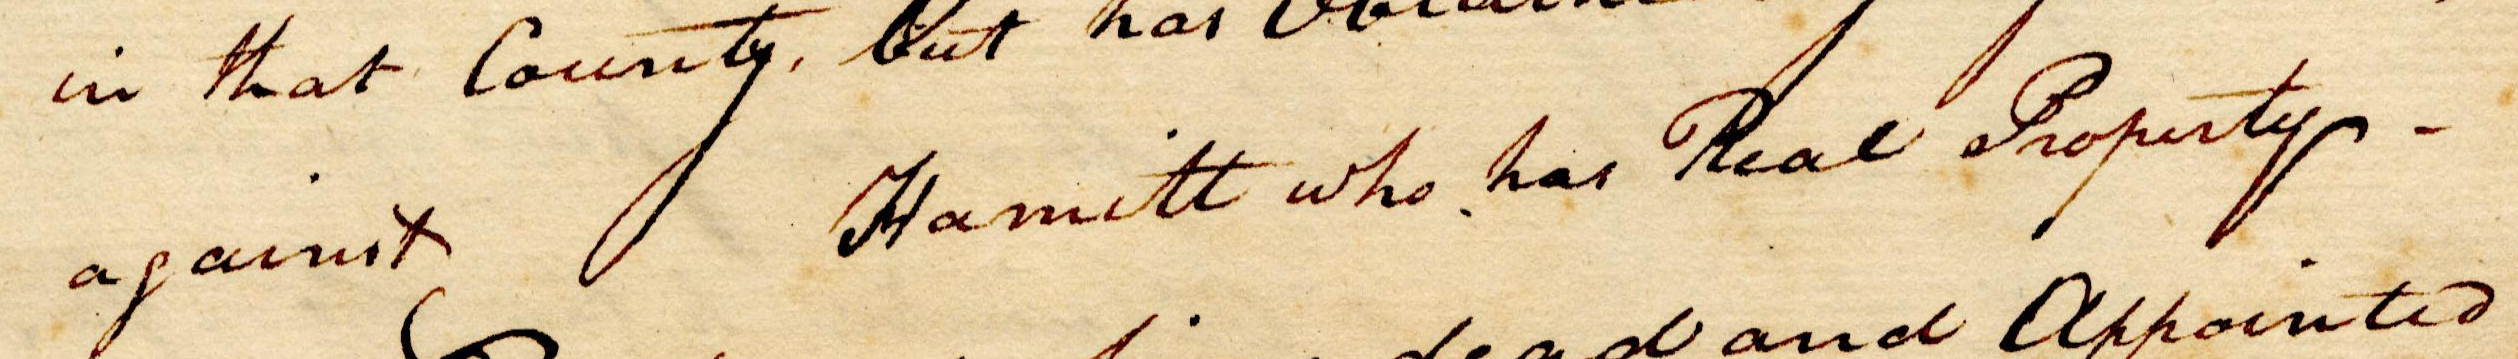against Hamitt who has real Property-
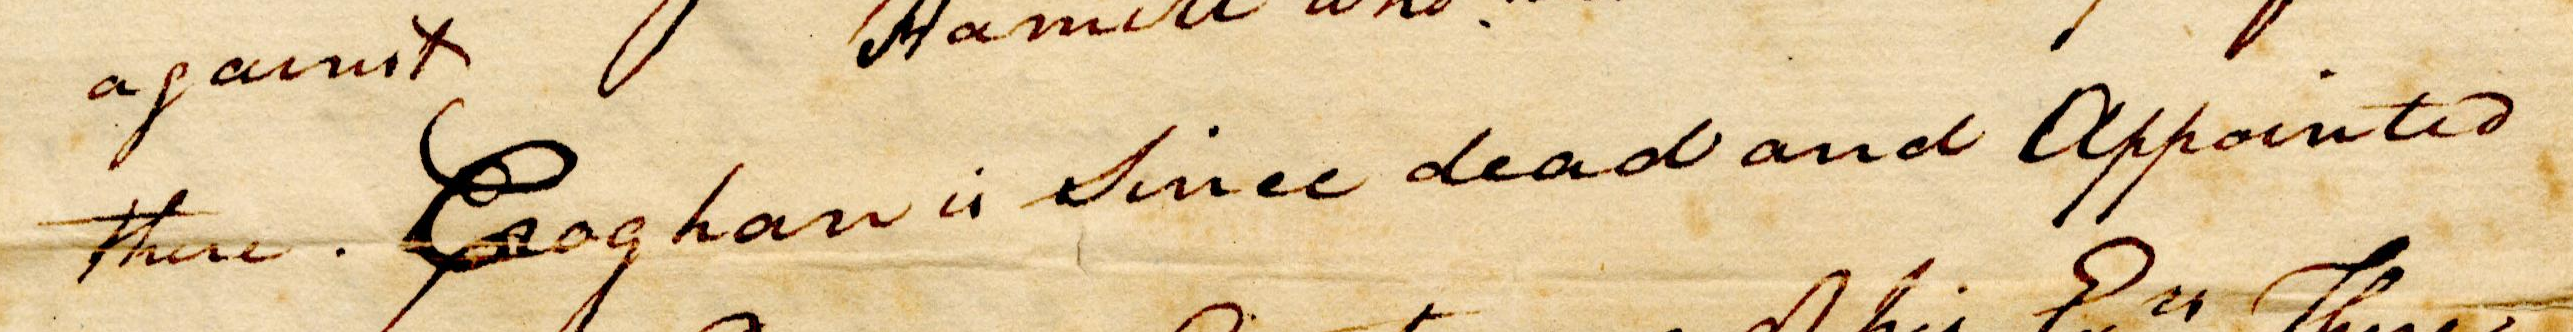that Croghan is since dead and appointed
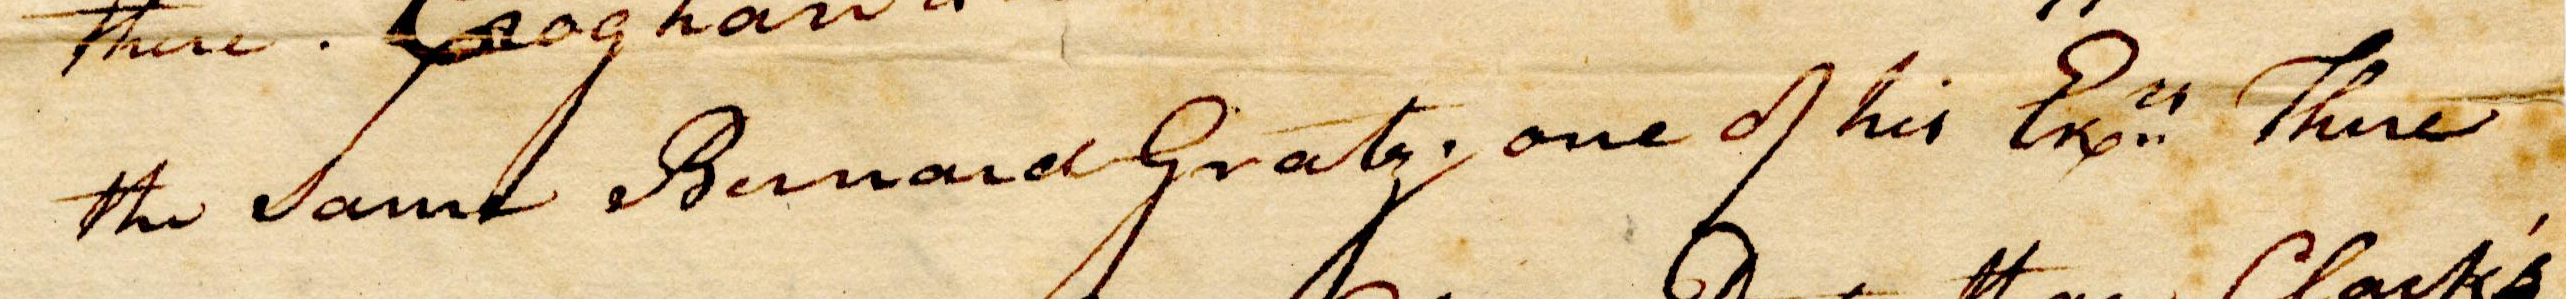the same Bernard Gratz, one of his Exc^rs. There
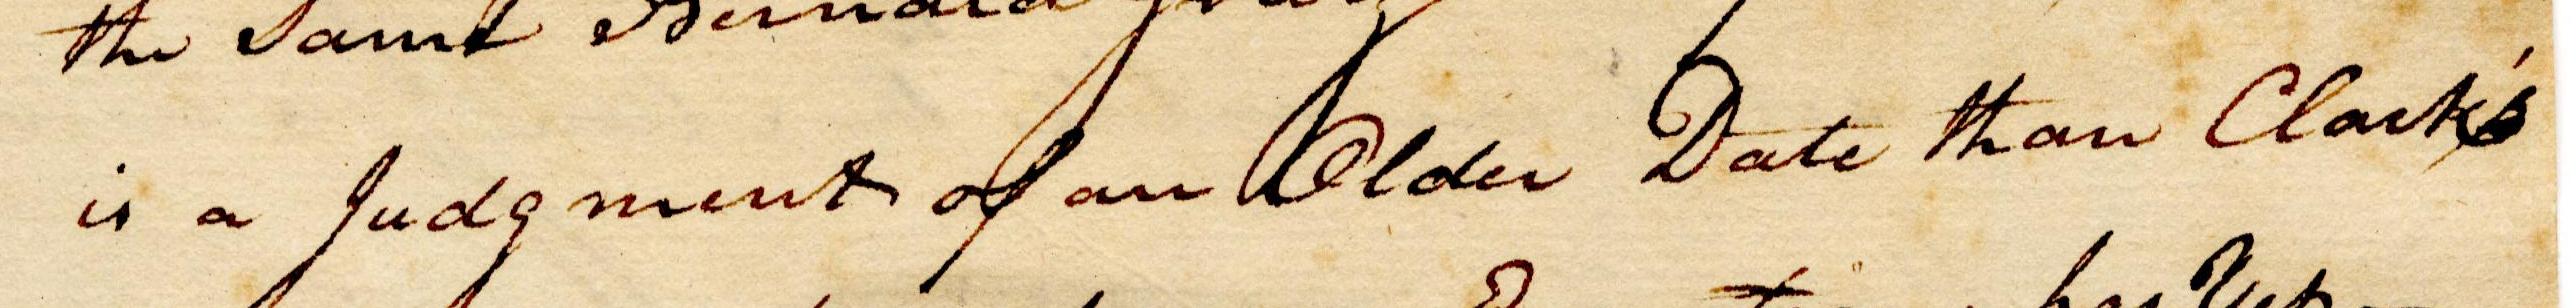is a judgment of an Older Date than Clark's
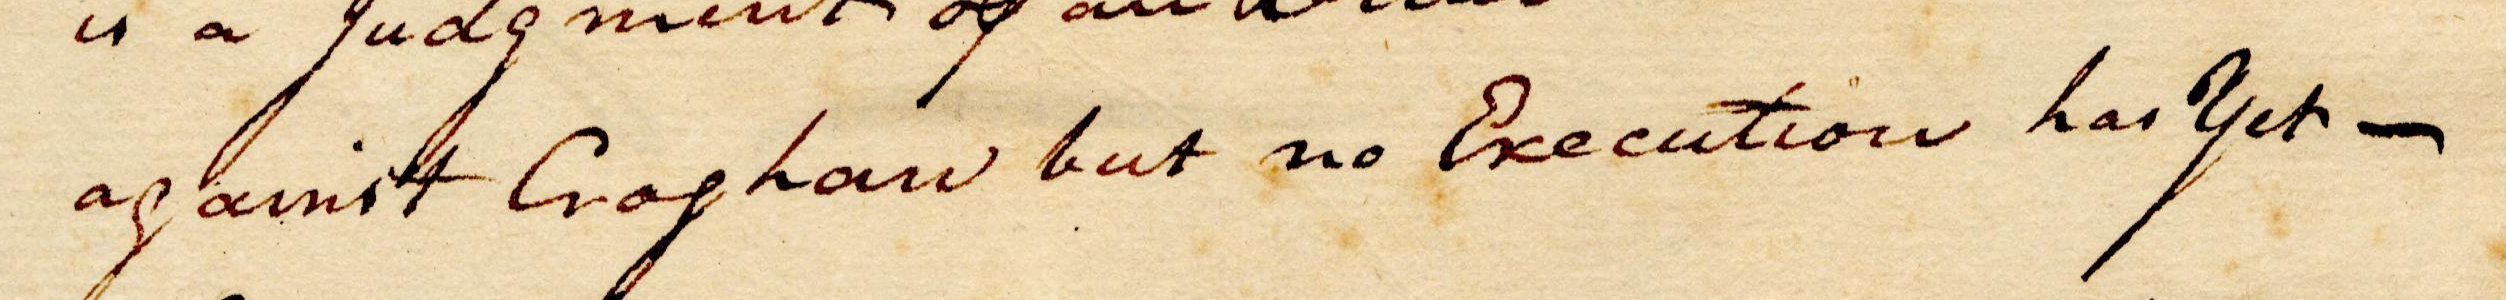against Croghan but no Execution has Yet-
